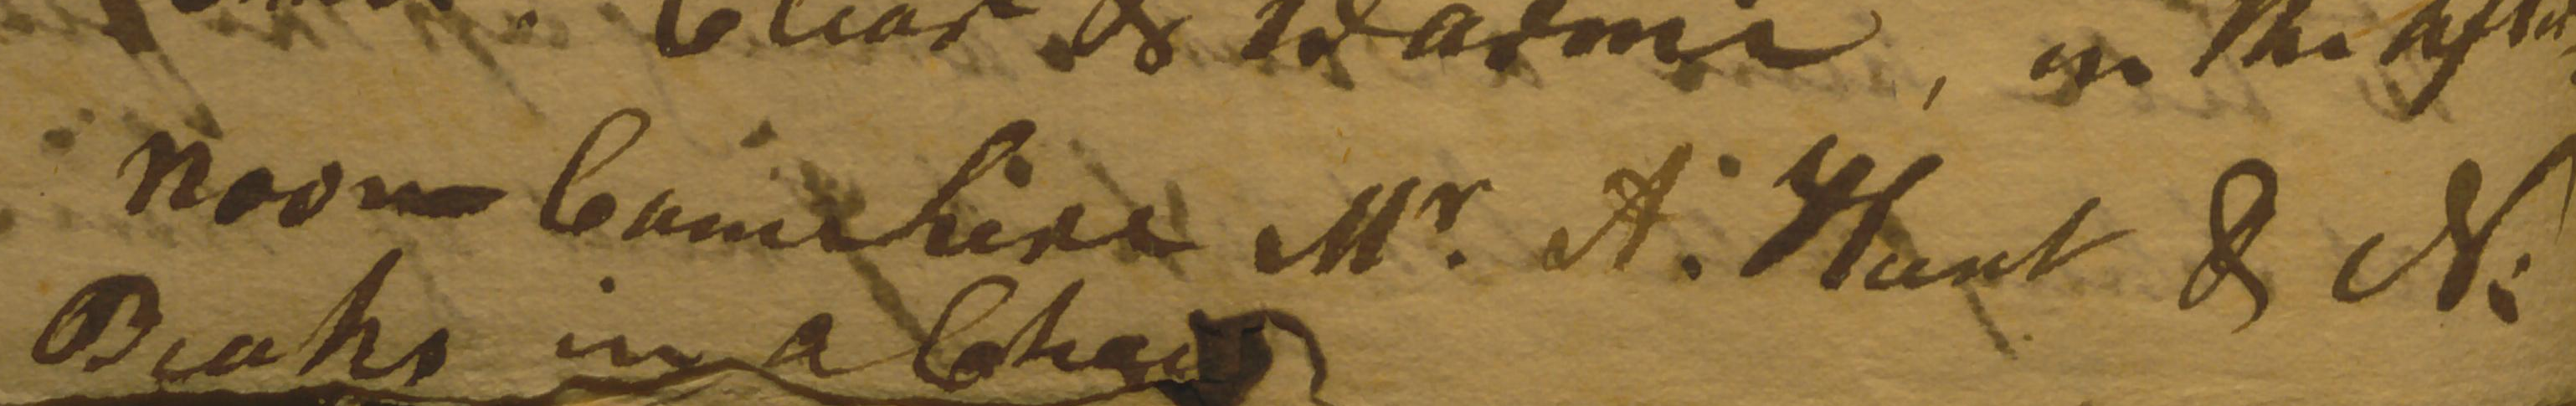noon Came here M^r. A: Hunt & N
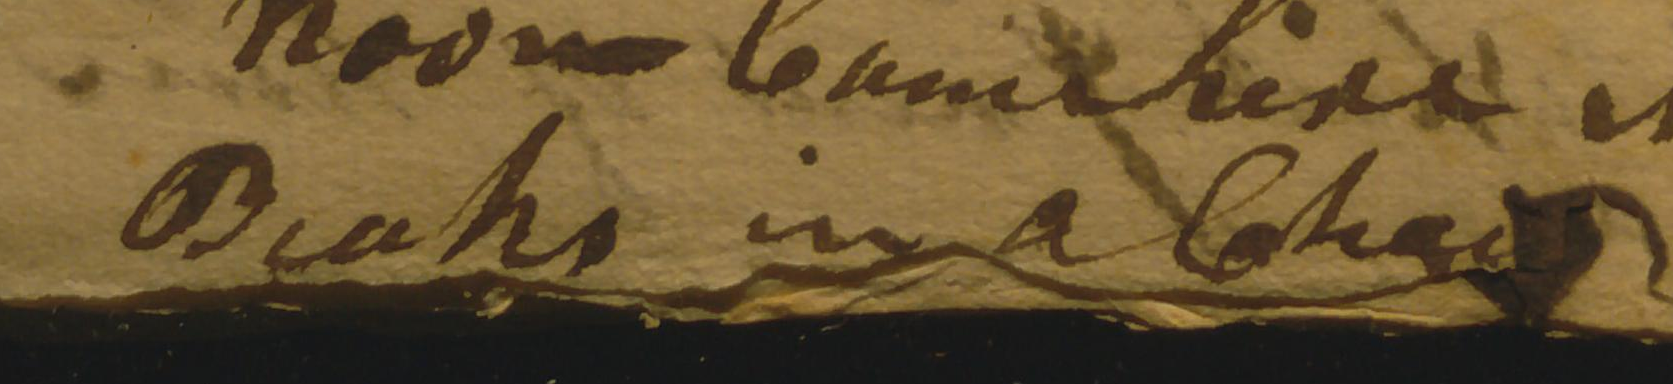Beaks in a Chair
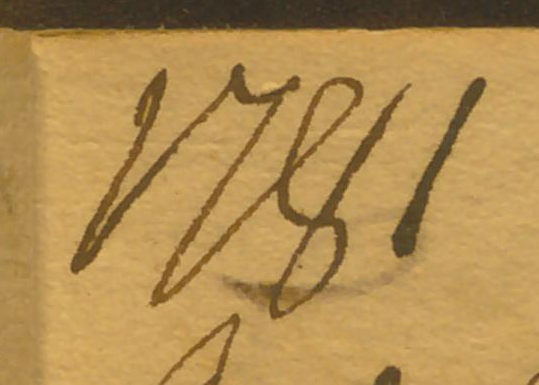1781
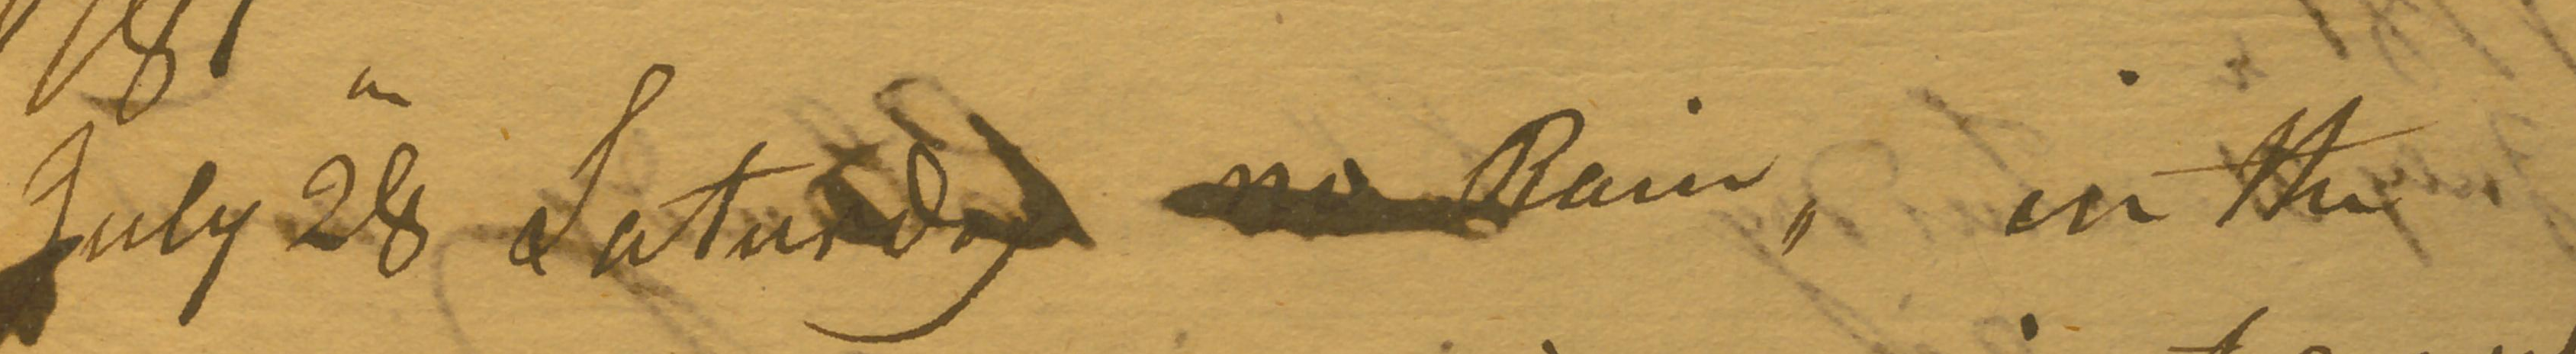July 28 Saturday no Rain, in the
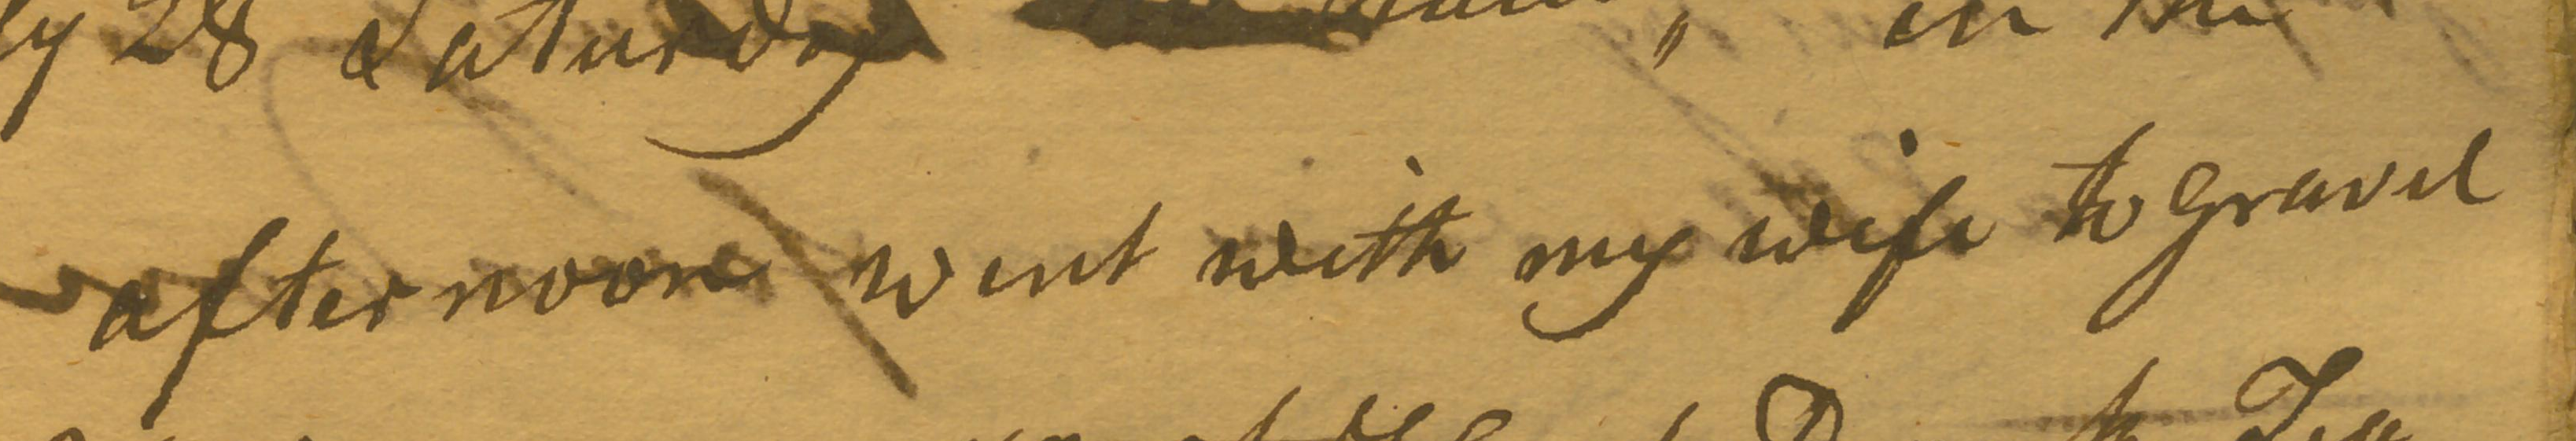afternoon went with my wife to gravel
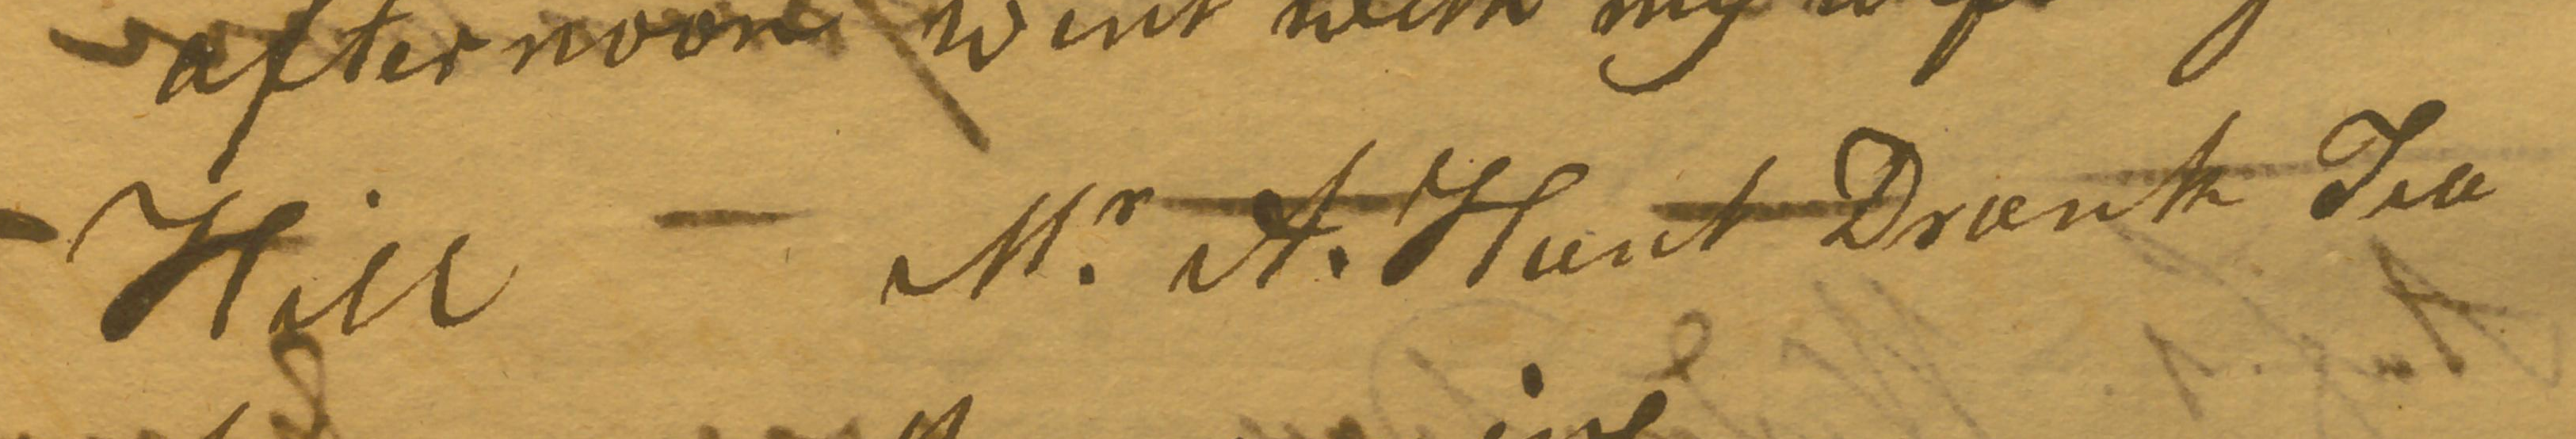Hill M^r. A. Hunt Drank Tea
